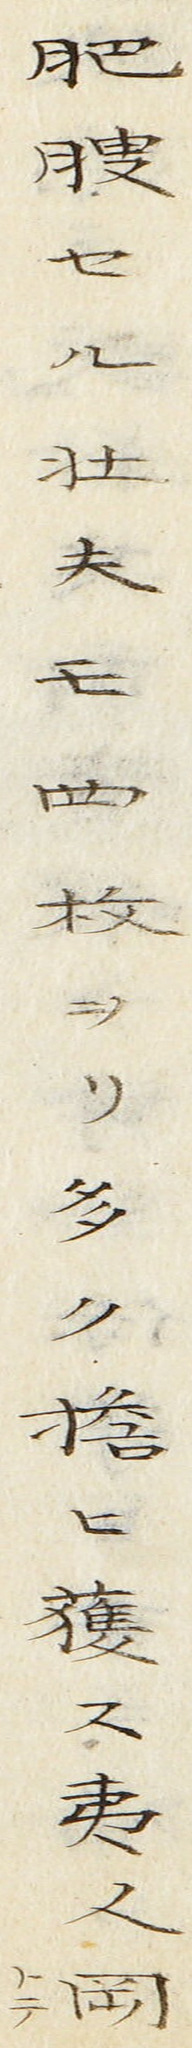肥セル壮夫モ四枚ヲリ多ク擔？ヒ獲ス夷人岡
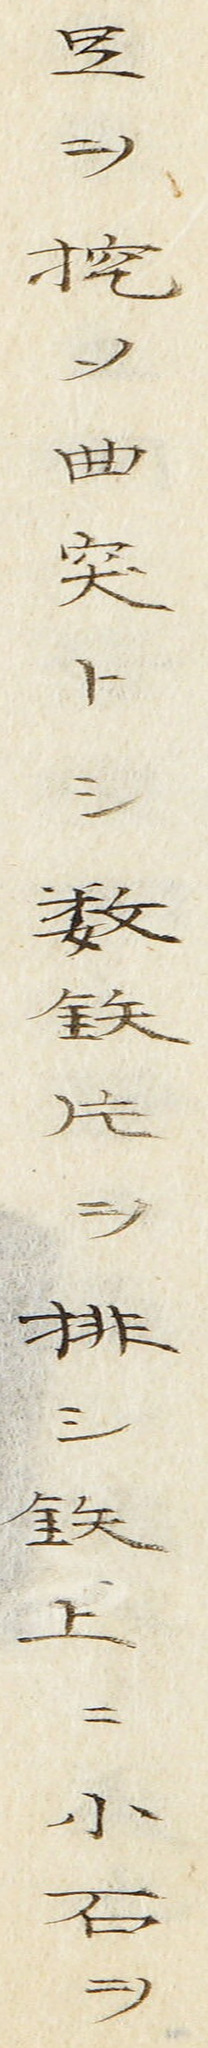足ヲ挖シテ曲突トシ数鉄片ヲ排シ鉄上ニ小石ヲ
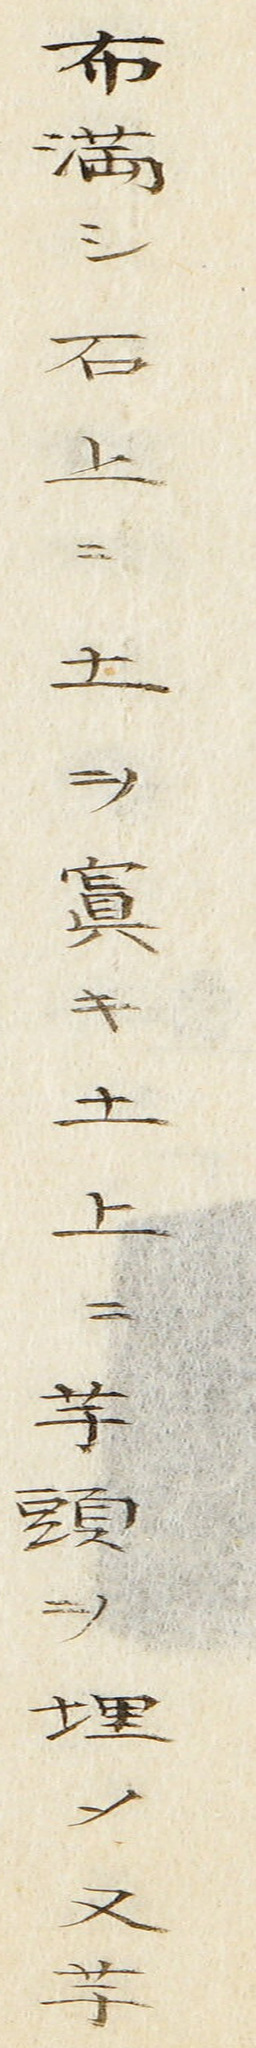布満シ石上ニ土ヲ寘キ土上ニ芋頭ヲ埋メ又芋
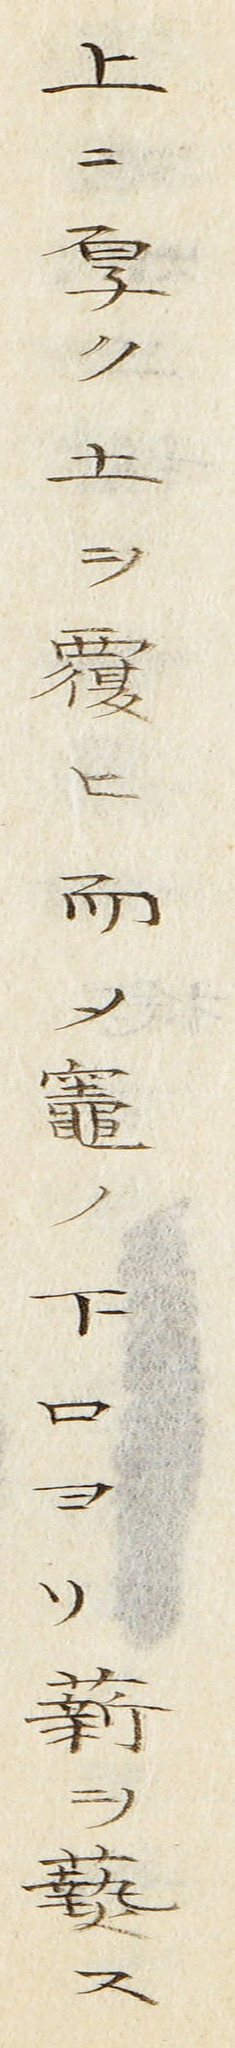上ニ厚ク土ヲ覆ヒ而シテ竈ノ下口ヨリ薪ヲ爇？ス
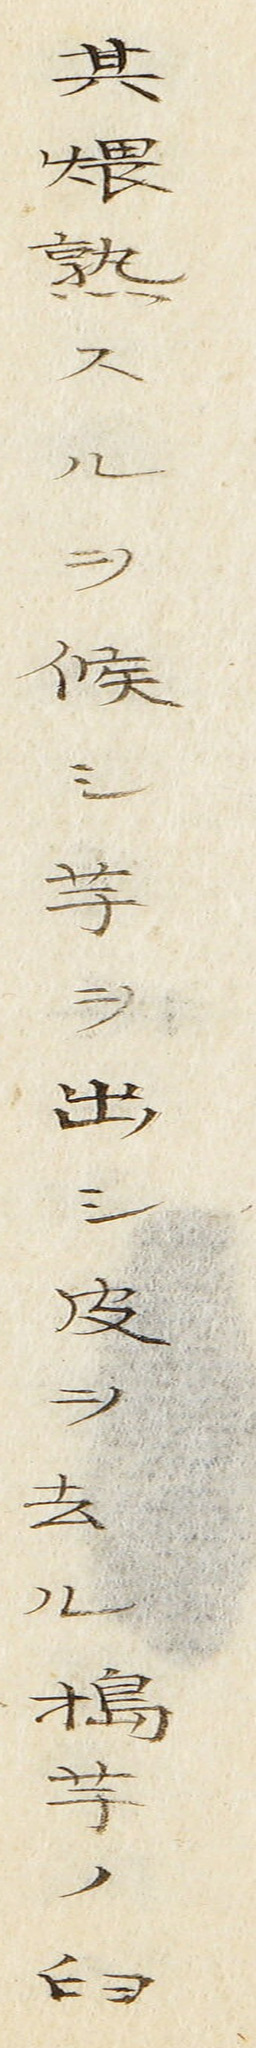其煨熟スルヲ候シ芋ヲ出シ皮ヲ去ル搗芋ノ臼
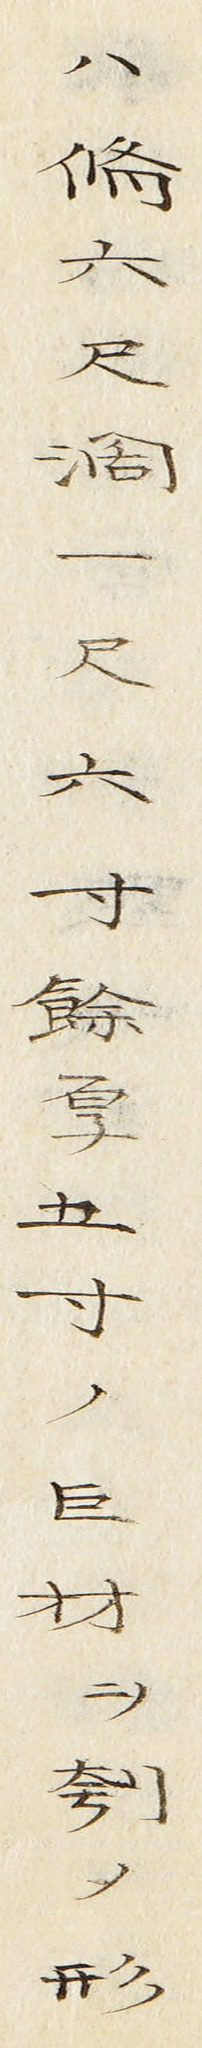ハ修六尺濶一尺六寸余厚五寸ノ巨材ヲ刳シテ形
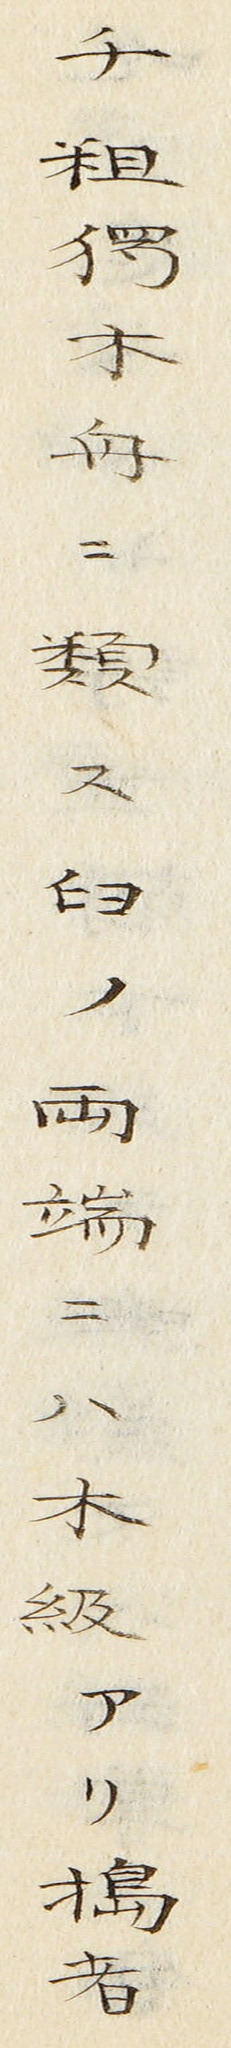チ粗獨？木舟ニ類ス臼ノ両端ニハ木級アリ搗者
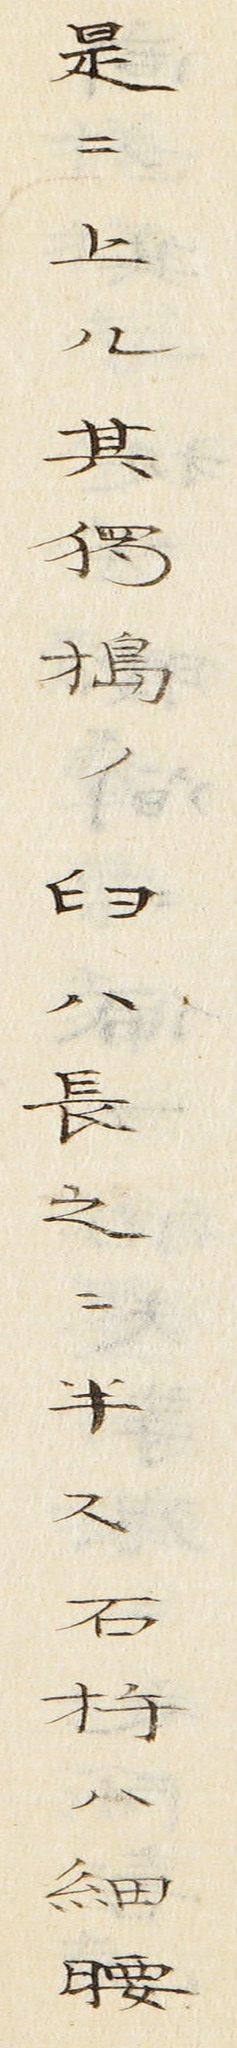是ニ上ル其獨？搗ノ臼ハ長之ニ半ス石杵ハ細腰
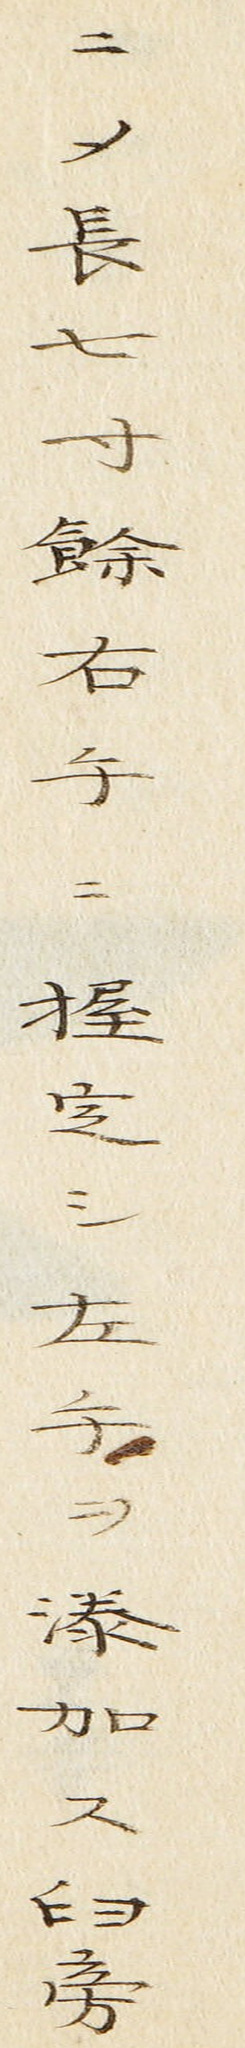ニシテ長七寸余右手ニ握定シ左手ヲ添？加ス臼旁
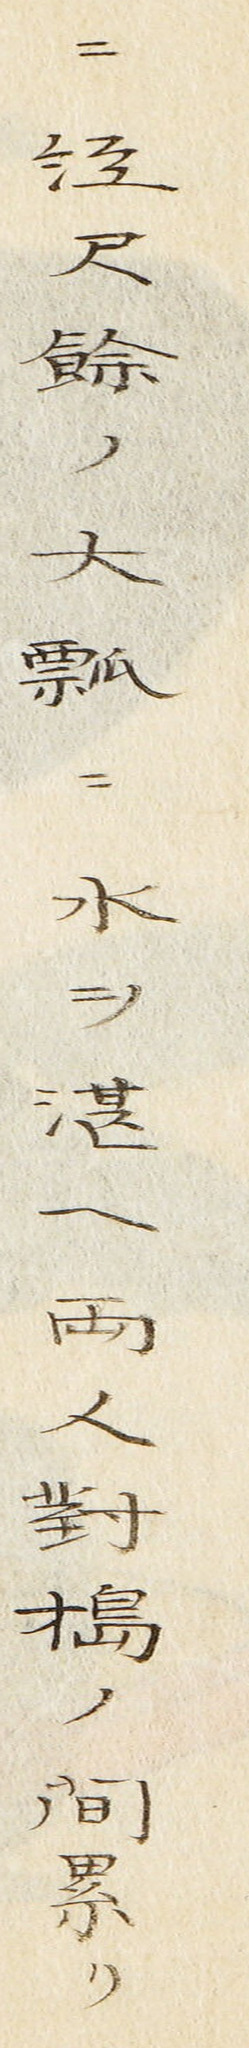ニ経？尺余ノ大瓢ニ水ヲ湛ヘ両人対搗ノ間累リ
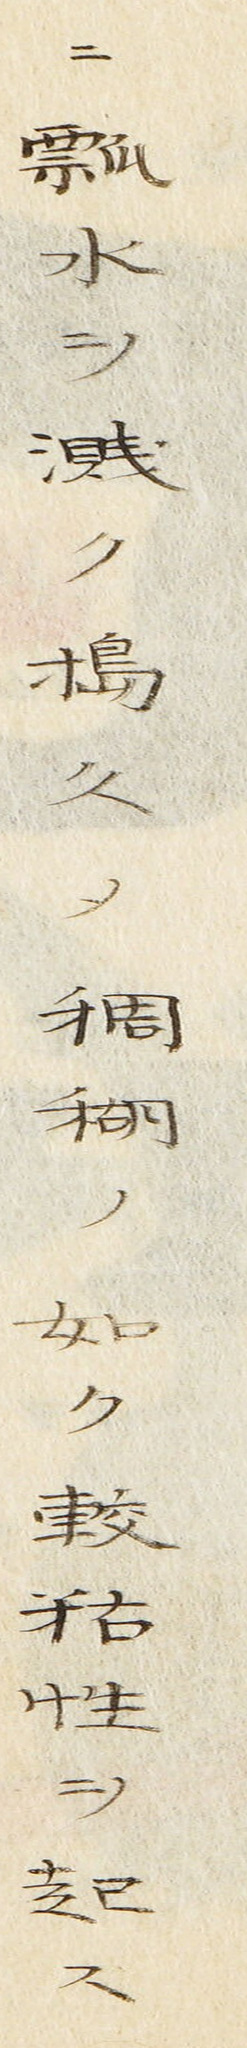ニ瓢水ヲ濺ク搗久シテ稠ノ如ク較粘性ヲ起ス
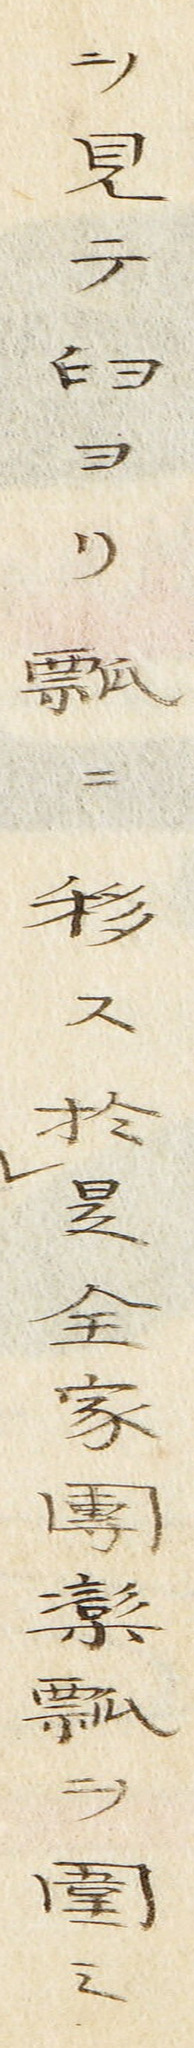ヲ見テ臼ヨリ瓢ニ移ス於是全家団欒瓢ヲ囲ミ
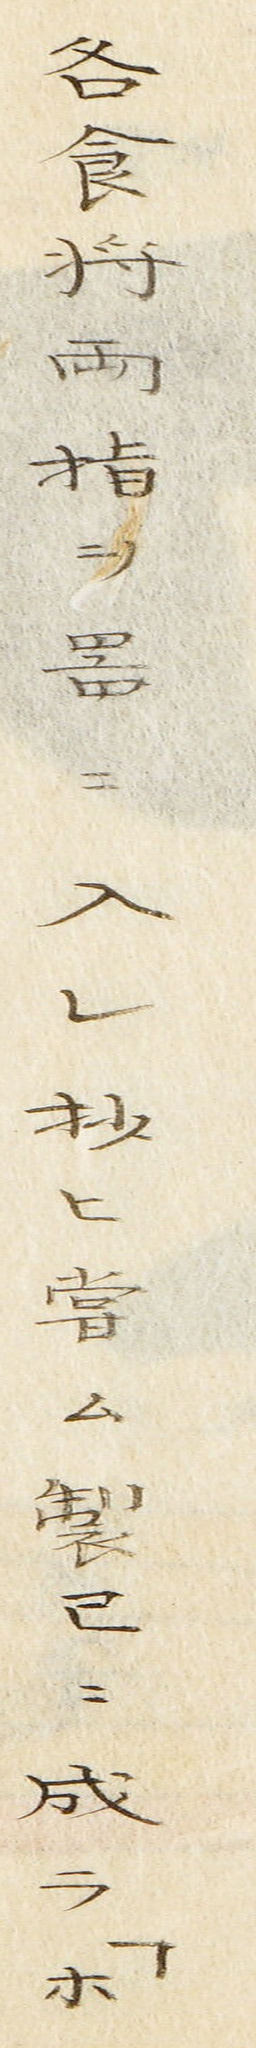各食将両指ヲ器ニ入レ抄ヒ嘗ム製已ニ成ラ「ホ
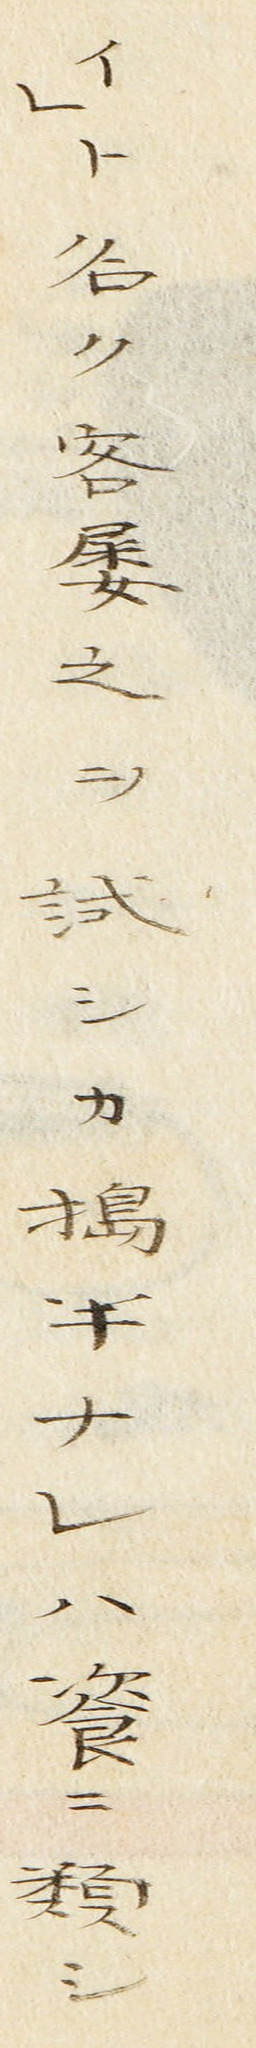イ」ト名ク客屡之ヲ試シカ搗半ナレハ餈ニ類シ
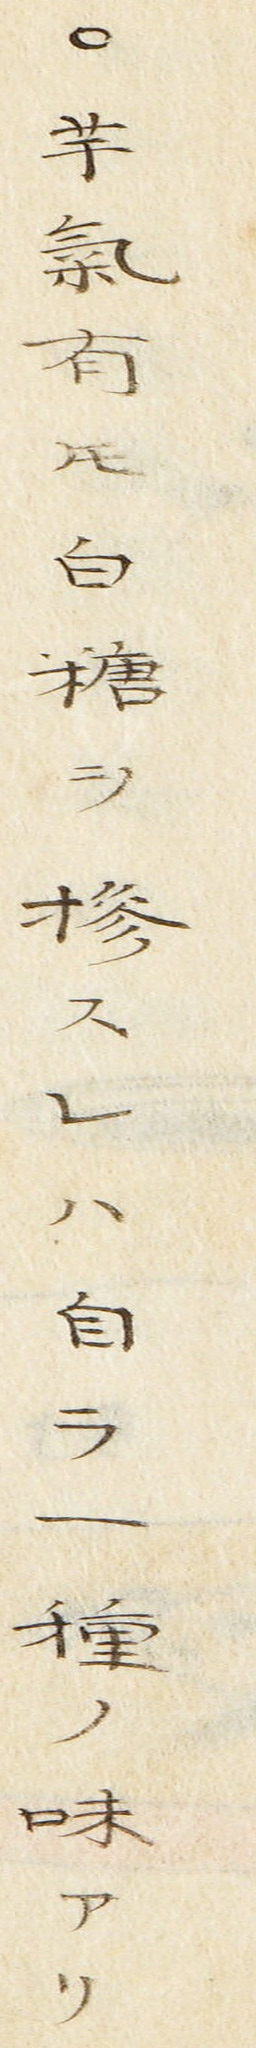〇芋気有トモ白糖ヲ摻スレハ自ラ一種ノ味アリ
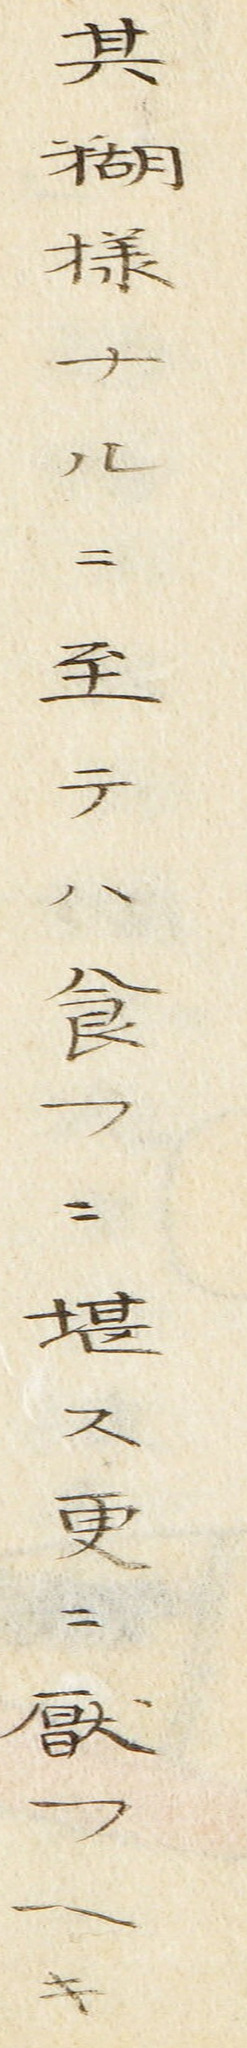其糊様ナルニ至テハ食フニ堪ス更ニ厭フヘキ
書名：蕃談
